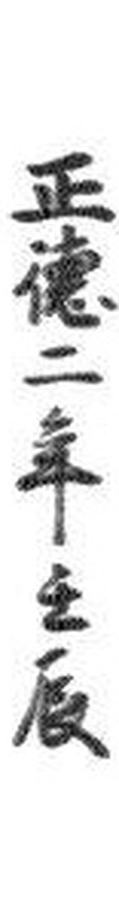正徳二年壬辰
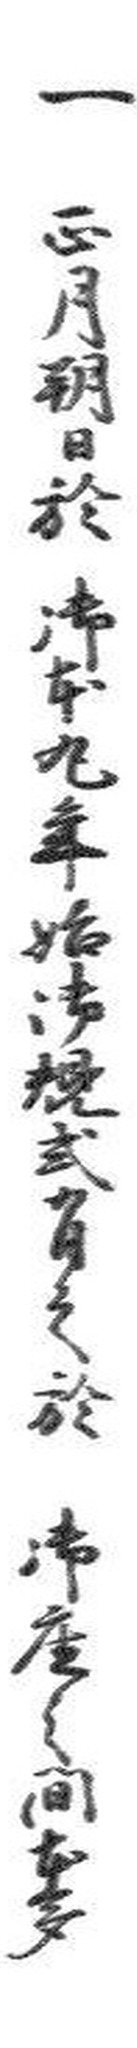一正月朔日於御本丸年始御規式有之於御座之間本多
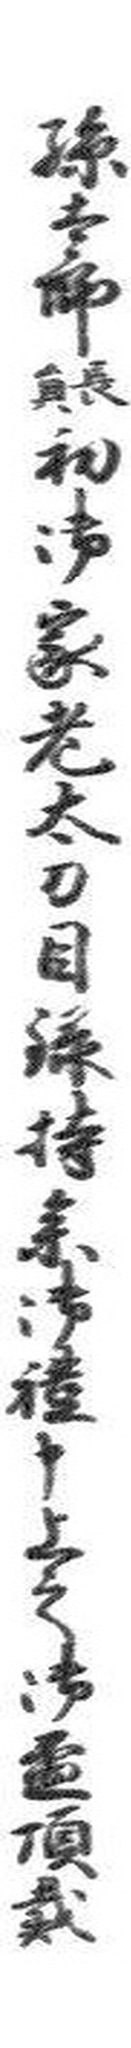孫太郎長員初御家老太刀目録持参御礼申上之御盃頂戴
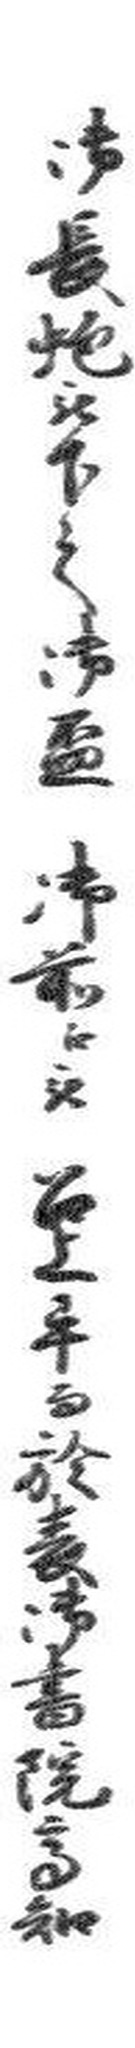御長蚫被下之御盃御前江被召上畢而於表御書院高知
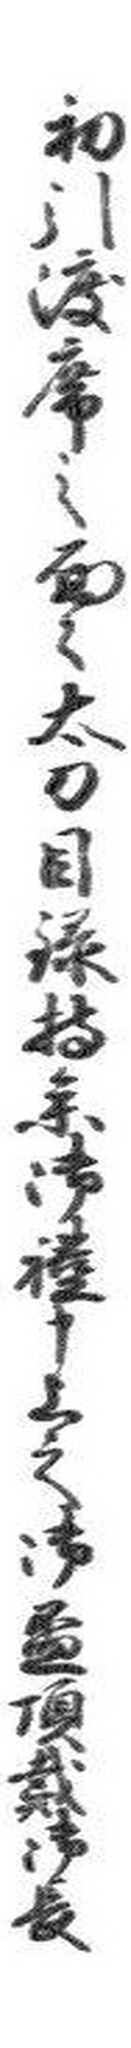初引渡席之面々太刀目録持参御礼申上之御盃頂戴御長
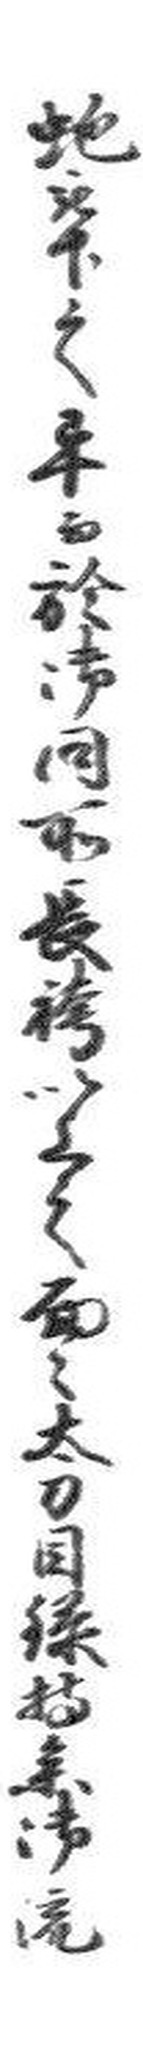蚫被下之畢而於御同所長袴以上之面々太刀目録持参御流
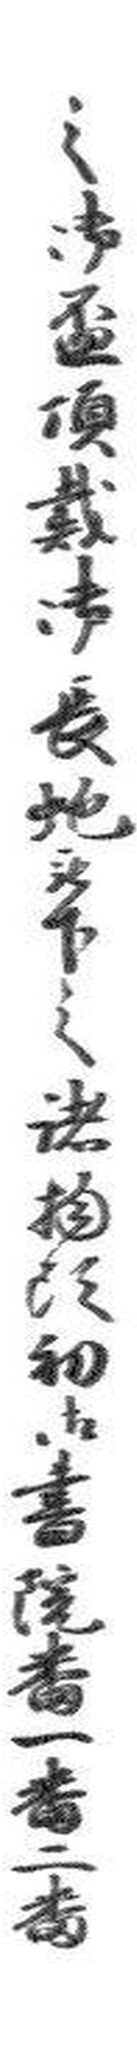之御盃頂戴御長蚫被下之諸物頭初御書院番一番二番
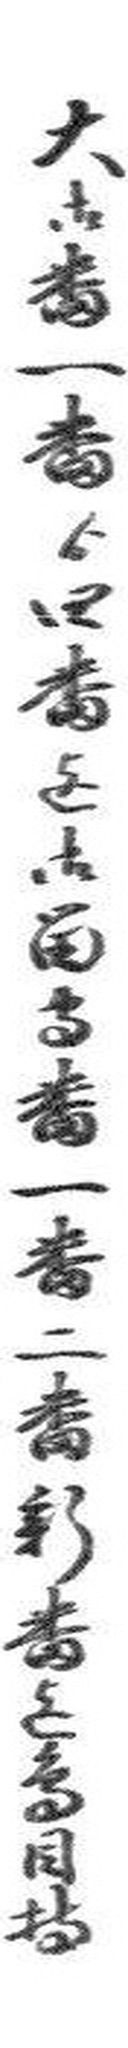大御番一番ゟ四番迄御留守番一番二番新番迄鳥目持

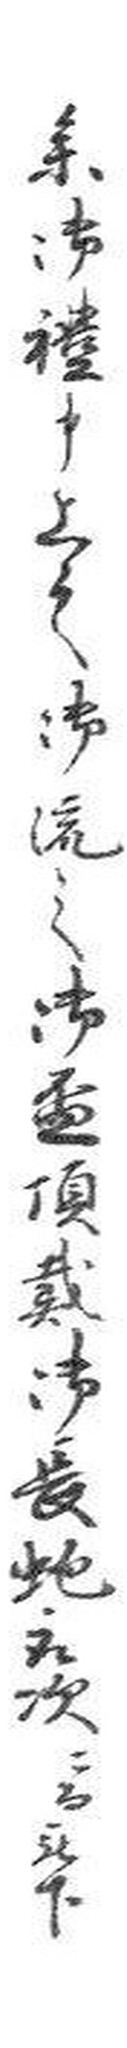参御礼申上之御流之御盃頂戴御長蚫取次ニ而被下
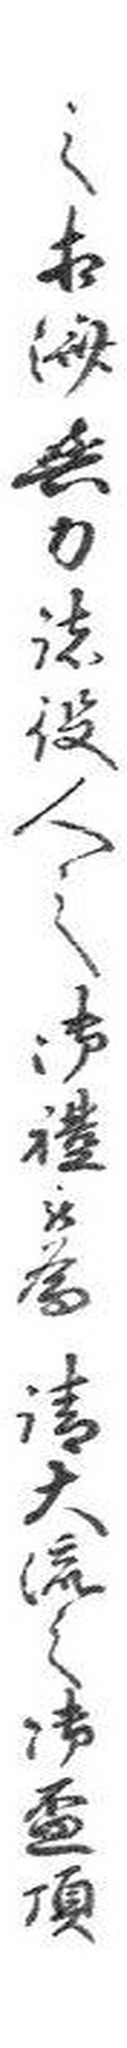之相済与力諸役人之御礼被為請大流之御盃頂
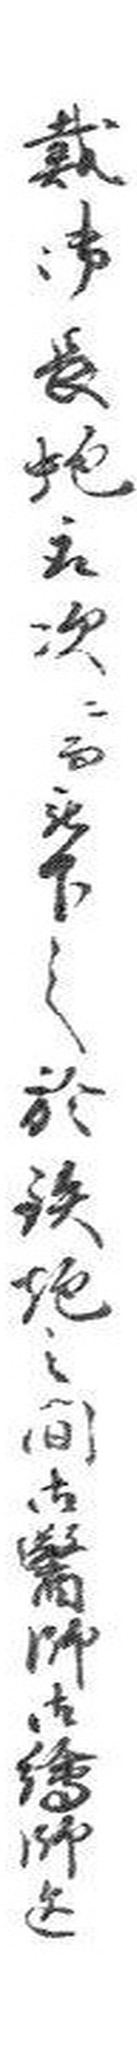戴御長蚫取次ニ而被下之於鉄砲之間御医師御絵師迄
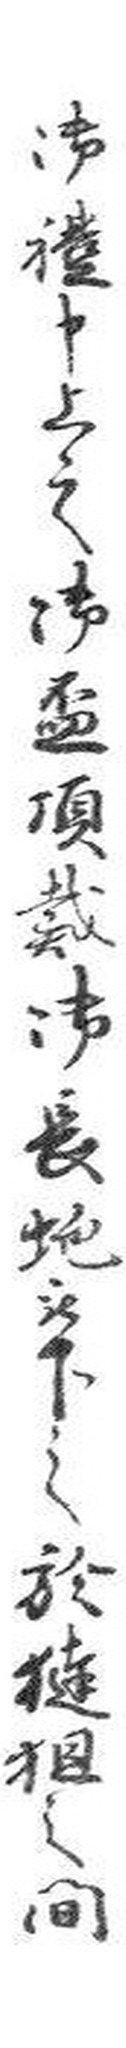御礼申上之御盃頂戴御長蚫被下之於韃靼之間
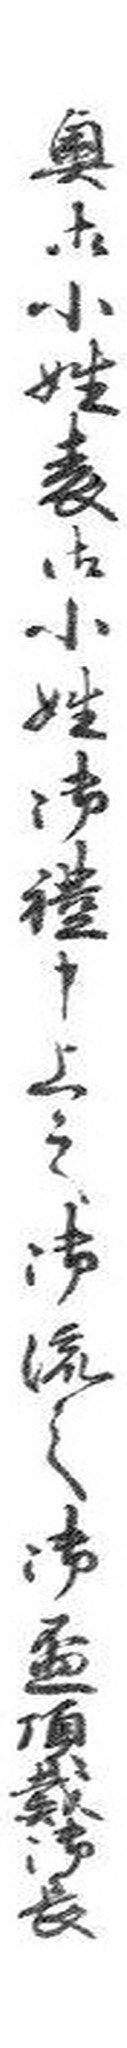奥御小姓表御小姓御礼申上之御流之御盃頂戴御長
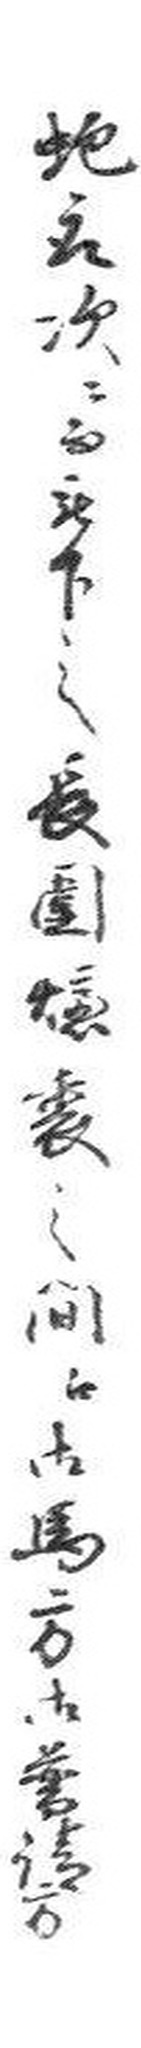蚫取次ニ而被下之長囲炉裏之間江御馬方御普請方
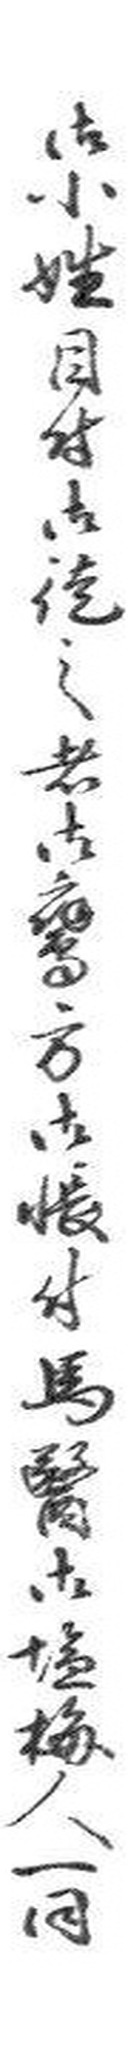御小姓目付御徒之者御鷹方御帳付馬医御塩梅人一同
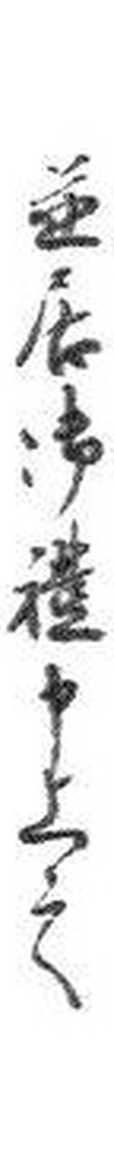並居御礼申上之
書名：家譜 二十九 吉邦公 従正徳二年到正徳三年
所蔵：福井県文書館 Fukui Prefectural Archives
